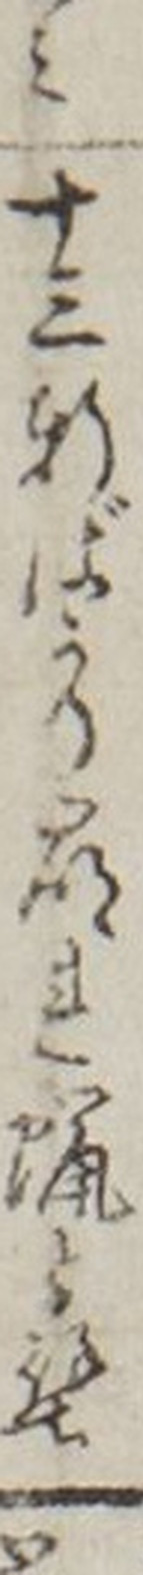十三軒ばかり崩れ蝋と壁
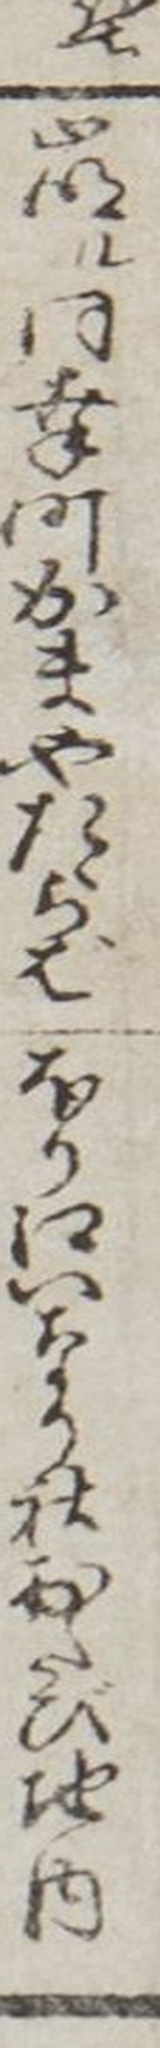崩る同幸町かまやたゝらば
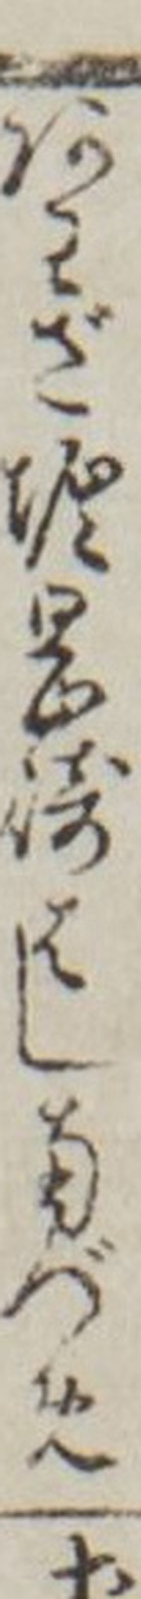あわざ堀岡崎はし南づめ
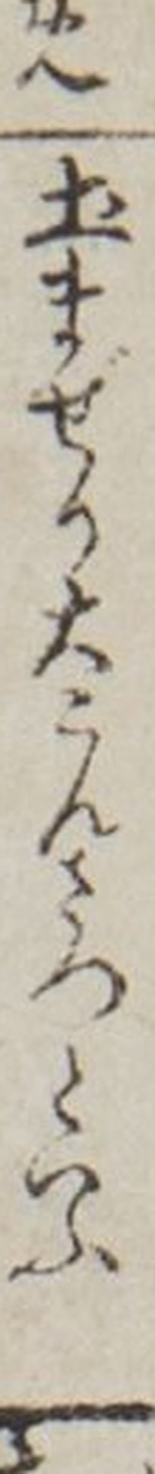土まぜり大こんさつといふ
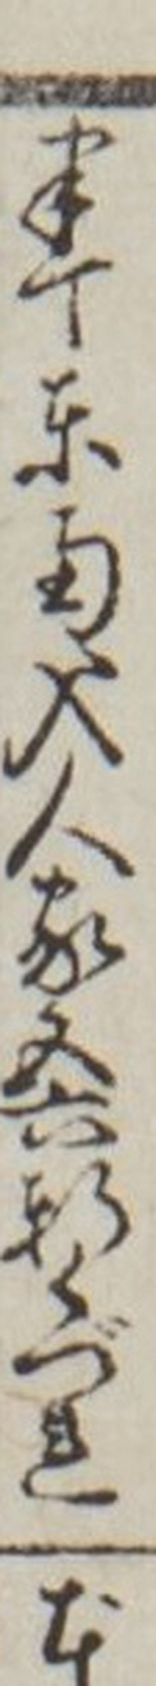半丁東南へ入人家五六軒くづれ
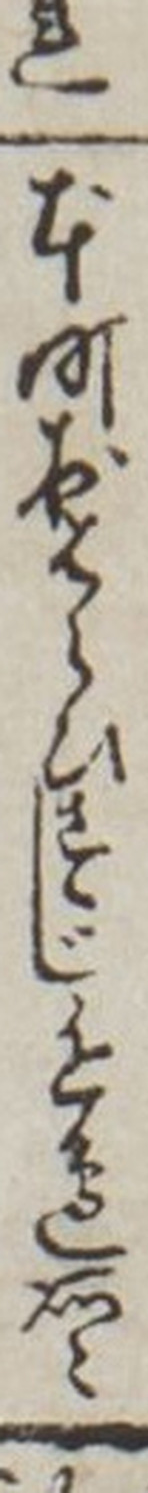本町おはらひすじ近辺所々
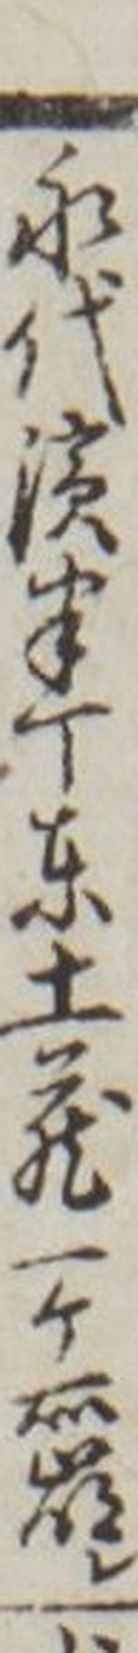永代浜半丁東土蔵一ヶ所崩れ
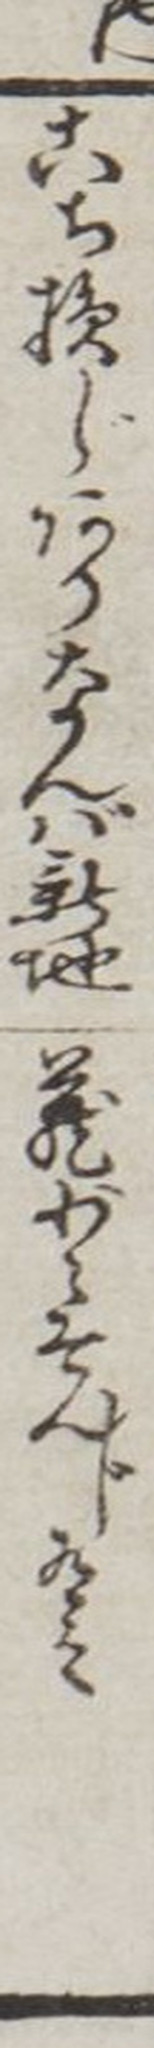こち損じありなんば新地
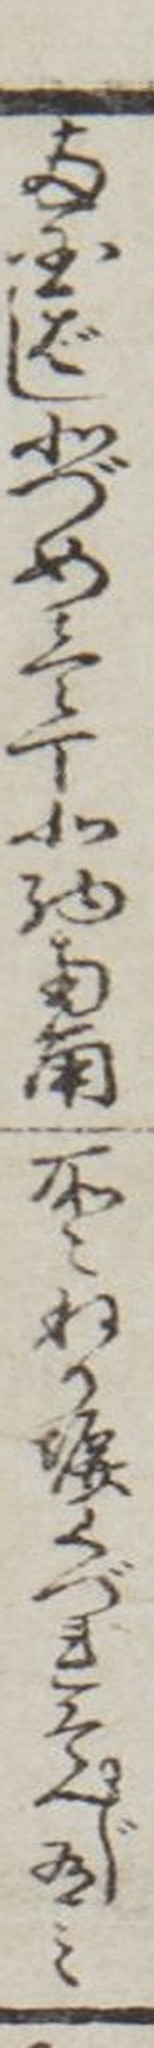両国ばし北づめ壱丁北西南角
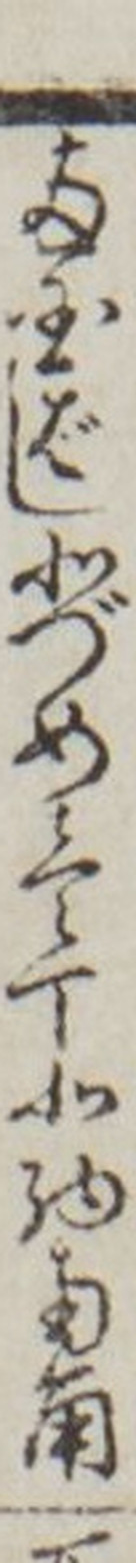両国ばし北づめ壱丁北西南角
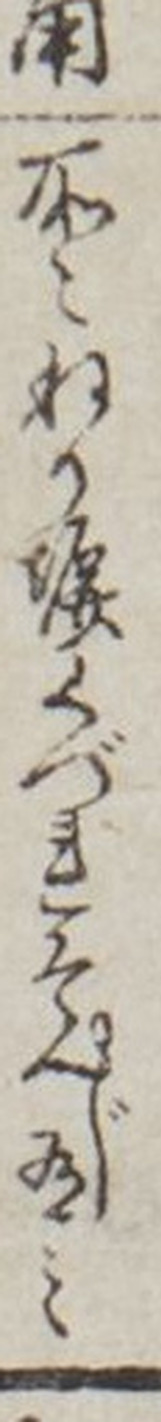所々ねり塀くづれそんじ有之
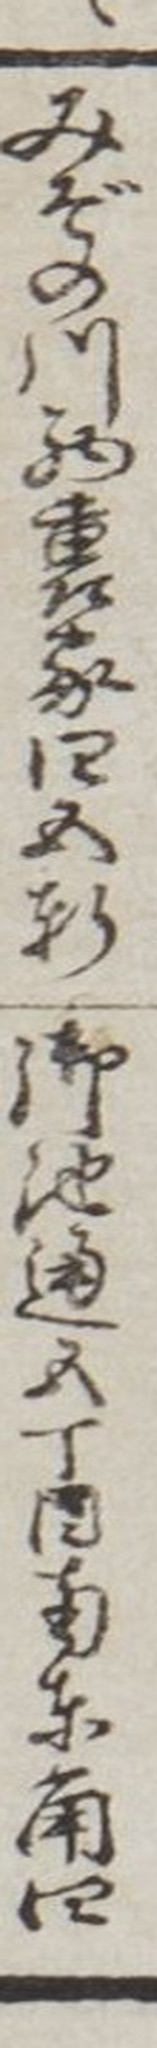みぞの川西裏家四五軒
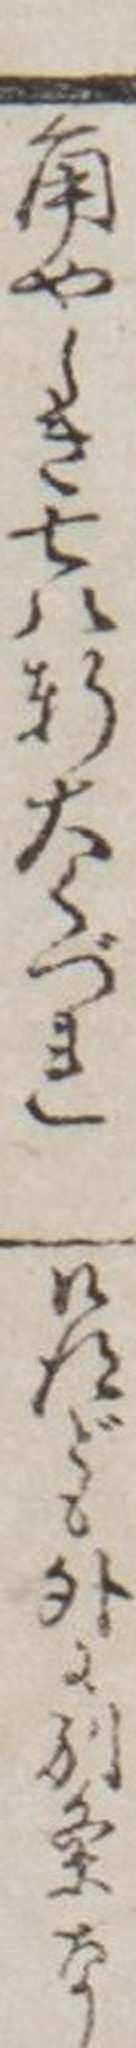角やしき七八軒大くづれ
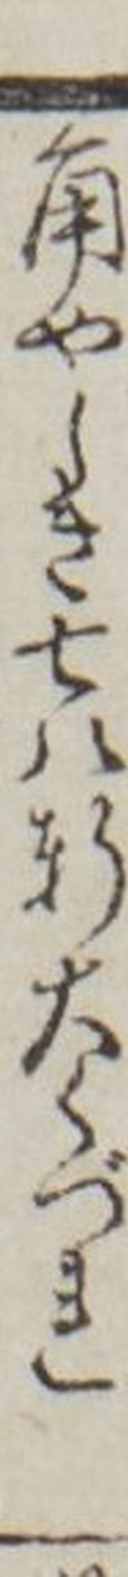角やしき七八軒大くづれ
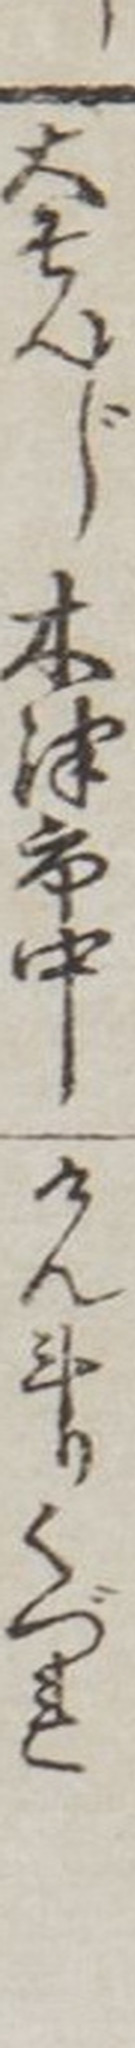大そんじ木津市中
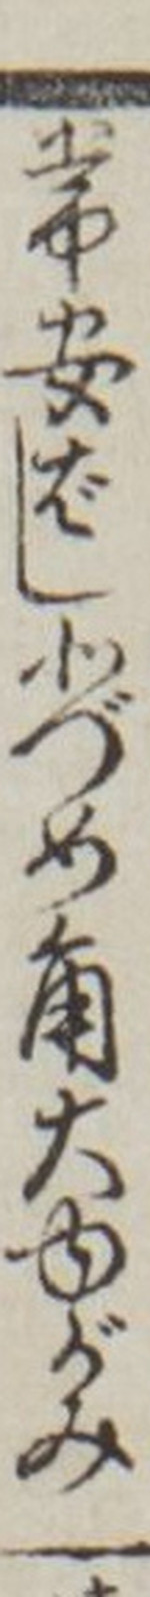常安ばし北づめ角大ゆがみ
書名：本しらべ大阪大地震の次第初編
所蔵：あいおいニッセイ同和損保株式会社
